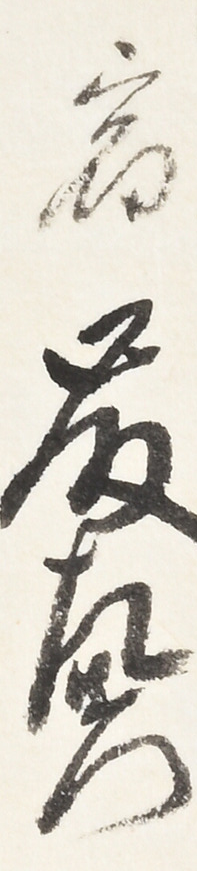宿籐左衛門
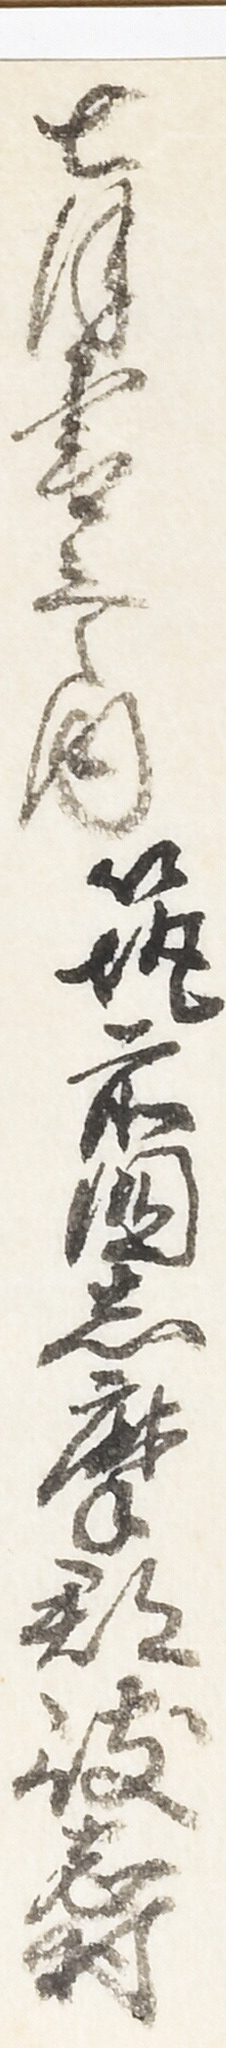七月書上之内筑前国志摩郡岐志村
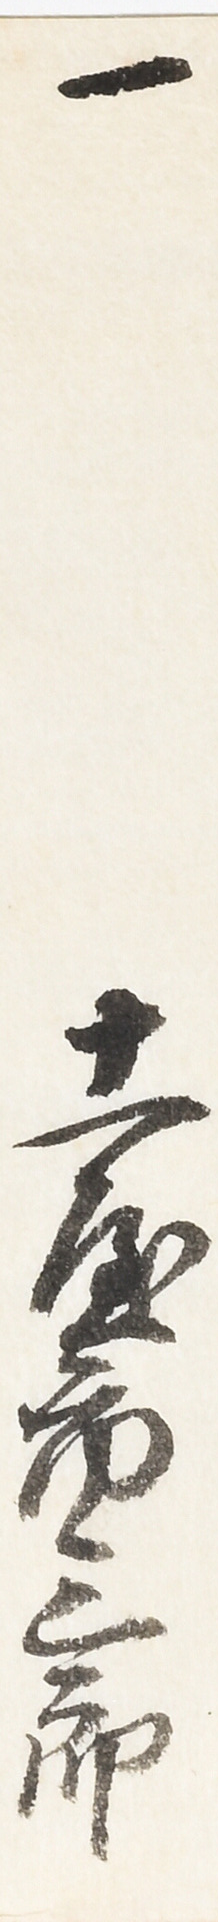一土屋市三郎
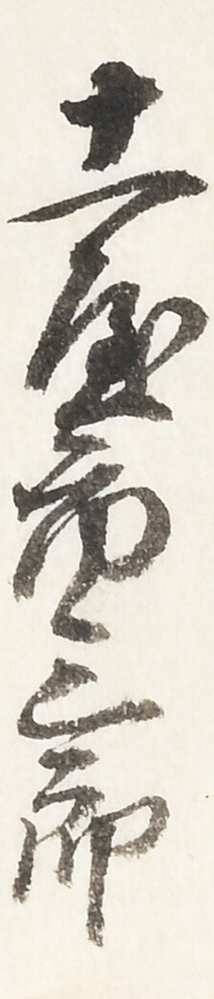一土屋市三郎
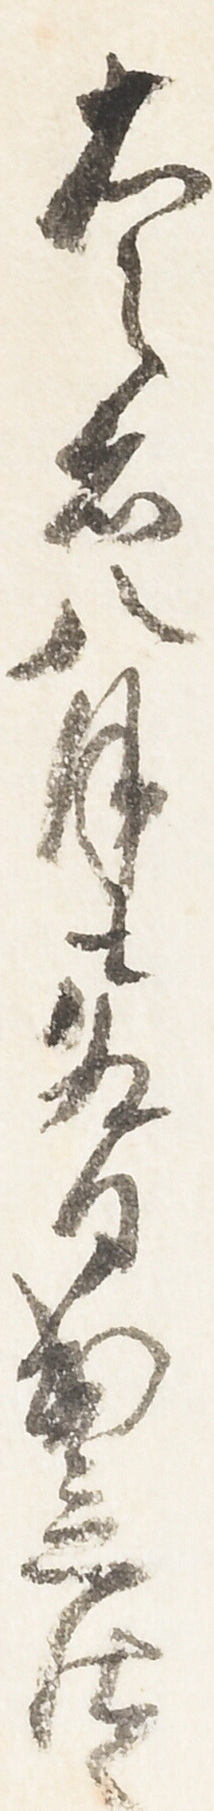右之者八月十九日出立仕候
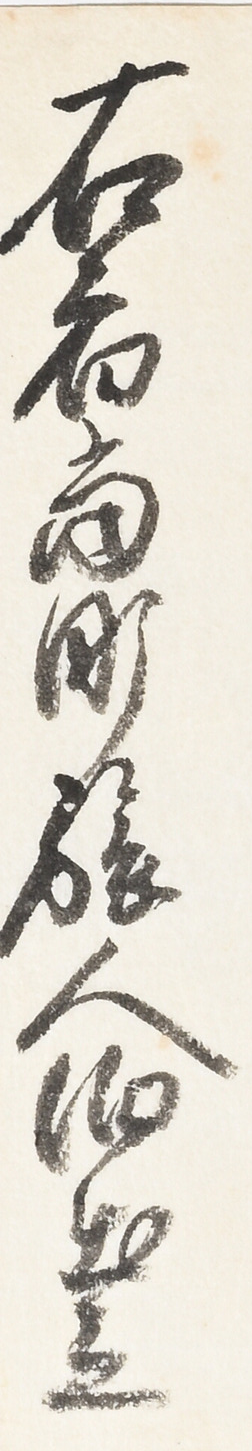右者当町旅人泊出立
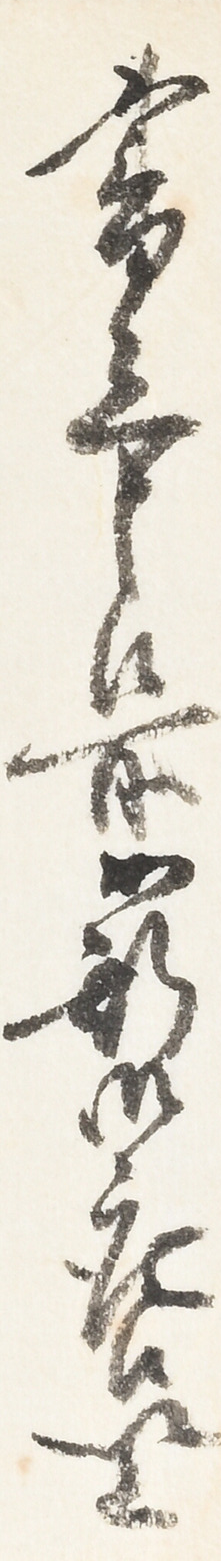書上申候所如斯御座候以上
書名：旅人泊控帳
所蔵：伊那市立高遠町図書館・合同会社AMANE
